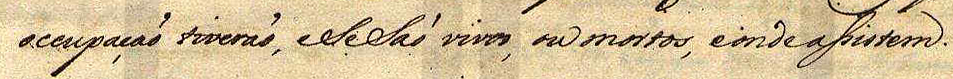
occupaçaõ tiveraõ, e Se Saõ vivos, ou mortos, e onde assistem.
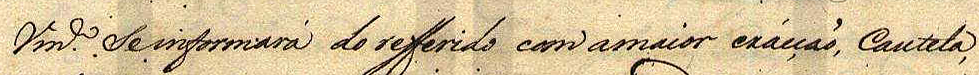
Vm.ce se informará do referido com a maior exacçaõ, Cautela,
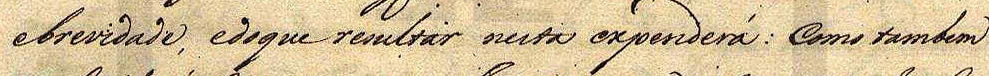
e brevidade, e do que resultar nesta expenderá: Como tambem
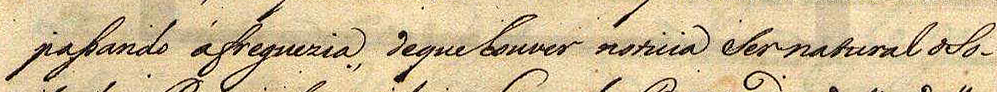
passando á freguezia, de que houver noticia Ser natural o So
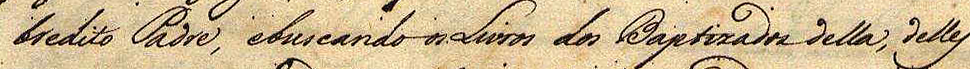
bredito Padre, e buscando os Livros dos Baptizadoz della, delles
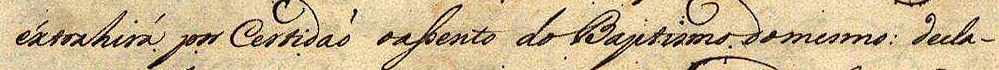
extrahirá por Certidaõ o assento do Baptismo do mesmo: decla
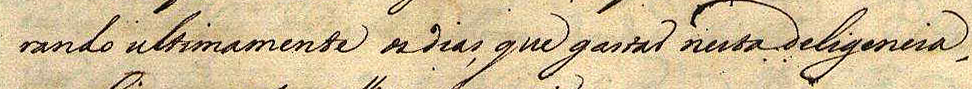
rando ultimamente os dias, que gastar nesta deligencia,
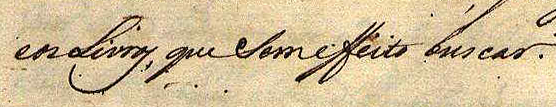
e os Livros, que Sem effeito buscar.
